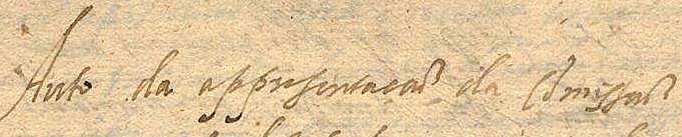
Auto da appresentaçaõ da Cōmissaõ
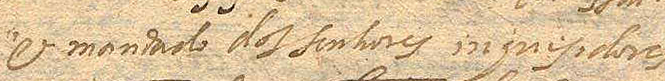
e mandado dos senhores inquisidores
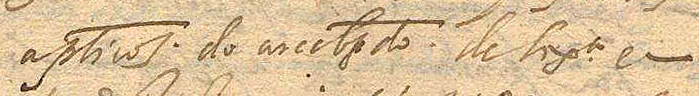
ap̄licos. do arceb̄pdo de lix.a e
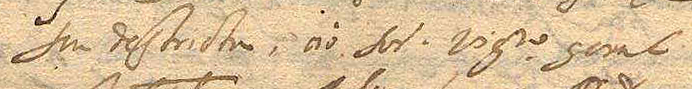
seu destricto, ao sor̄. vigr.o geral
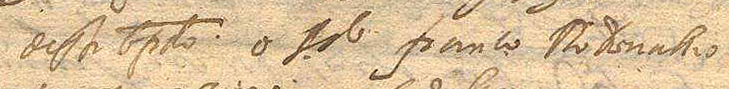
deste b̄pdo. o ldo franc.o Rodoualho
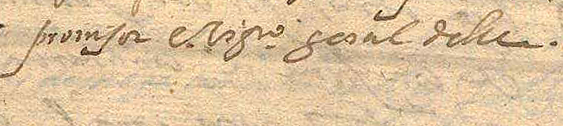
prouisor e vigr.o geral delle.
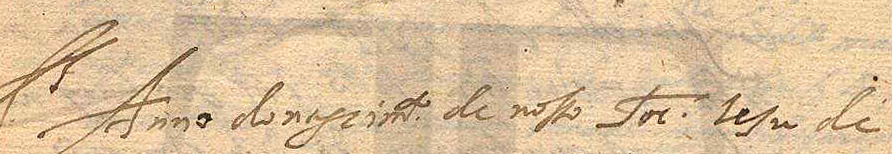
Anno do nascim.to de nosso S̄or̄. Iesu de
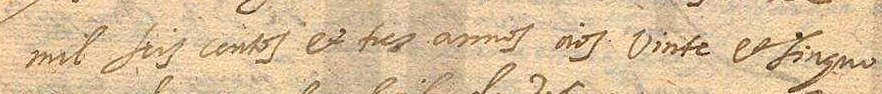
mil seiscentos & tres annos aos vinte & sinquo
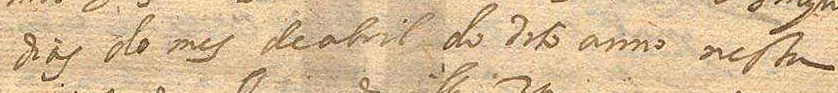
dias do mes de abril do dito anno nesta
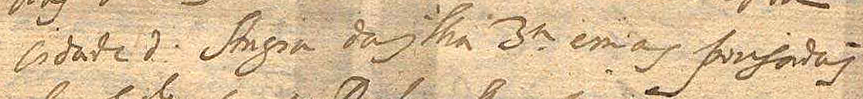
cidade d. Angra da jlha 3a em as pousadas
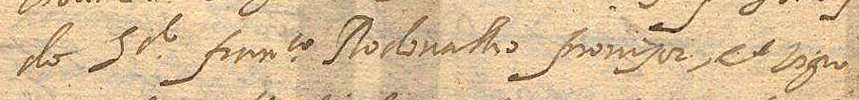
do Ldo. fran.co Rodoualho prouisor, & vigro
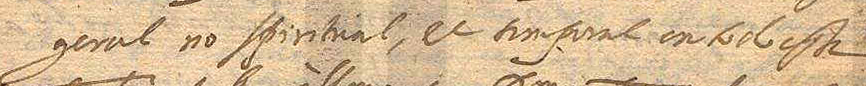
geral no spiritual, & temporal en todo este
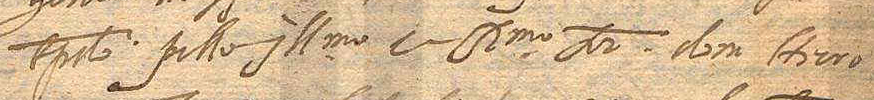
b̄pdo. pello jllmo e Rm.o s̄or dom Hiero
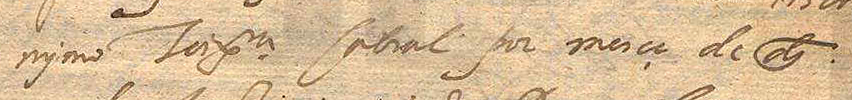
nymo Teixra Cabral por merce de d̄s
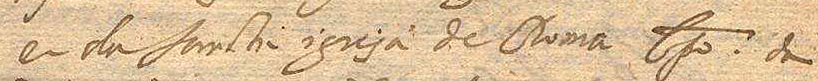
e da sancta igreja de Roma b̄po. da
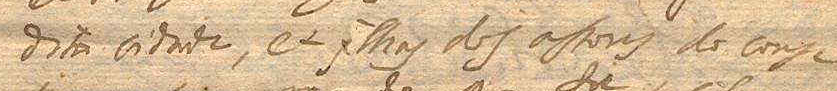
dita cidade, & jlhas dos assores do conse
